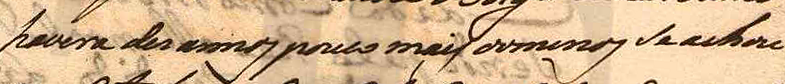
havera des annos pouco mais o menos se achou
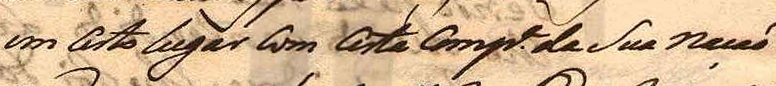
em certo lugar com certa comp.a da sua naçaõ
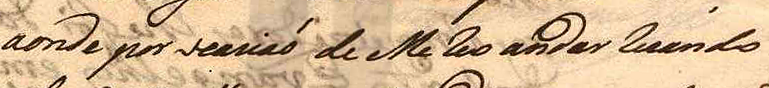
aonde por ocaziaõ de elle Reo andar Rezando
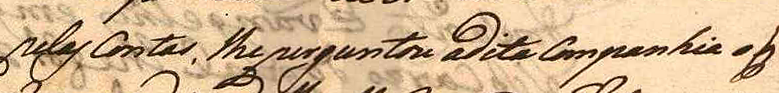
pelas Contas, lhe perguntou a dita Companhia o q̄
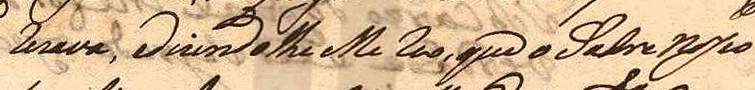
Rezava, e dizendolhe elle Reo, que o Padre nosso
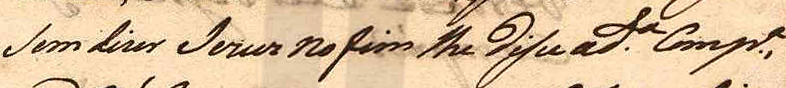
sem dizer Iezus no fim lhe disse a d.ta Comp.a,
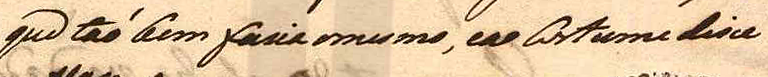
que taõbem fazia o mesmo, e ao Costume disce
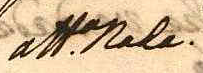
a tt.a Nada.
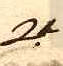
2.a
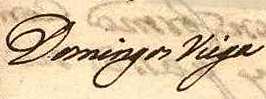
Domingos Veiga
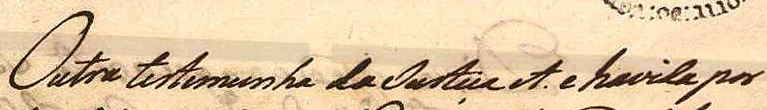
Outra testemunha da Iustiça A. e havida por
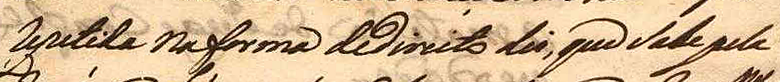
Repetida na forma de direito dis, que sabe pela
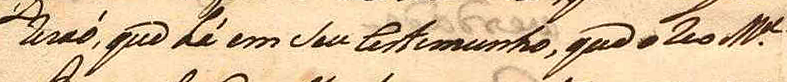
Rezaõ, que há em seu testemunho, que o Reo M.e
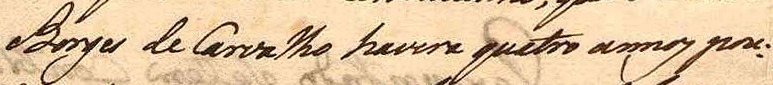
Borges de Carvalho havera quatro annos pou
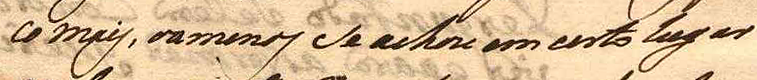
co mais, ou menos se achou em certo lugar
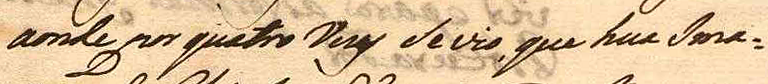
aonde por quatro Vezes se vio, que hua Ima
